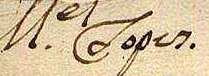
M.el Lopes.
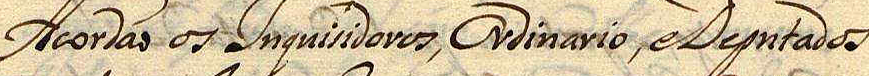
Acordaõ os Inquisidores, Ordinario, e Deputados
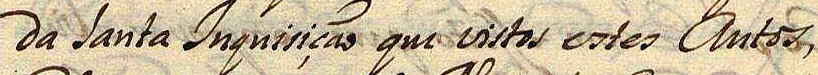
da Santa Inquisição que vistos estes Autos,
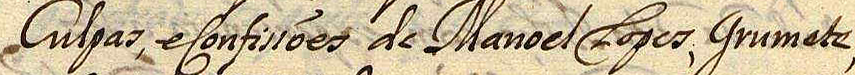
Culpas, e Confissões de Manoel Lopes, Grumete,
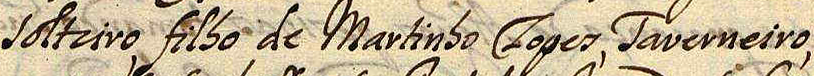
solteiro, filho de Martinho Lopes, Taverneiro,
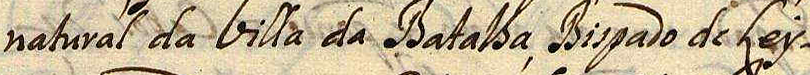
natural da Villa da Batalha, Bispado de Ley
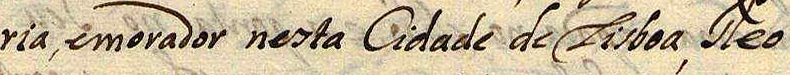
ria, e morador nesta Cidade de Lisboa, Reo
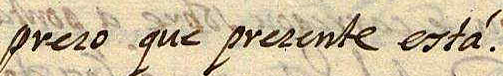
prezo que prezente está.
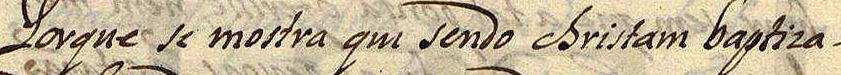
Porque se mostra que sendo christam baptiza
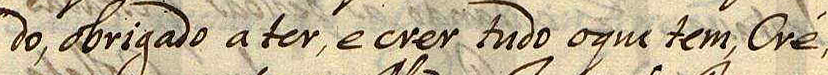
do, obrigado a ter, e crer tudo o que tem, Cré,
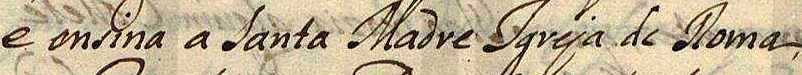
e ensina a Santa Madre Igreja de Roma,
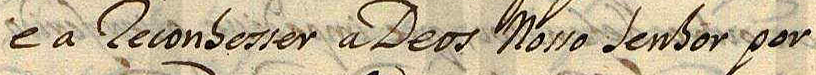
e a Reconhesser a Deos Nosso Senhor por
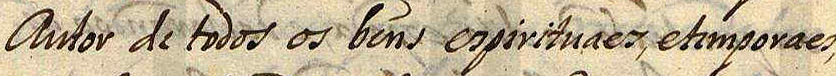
Autor de todos os bens espirituaes, e temporaes,
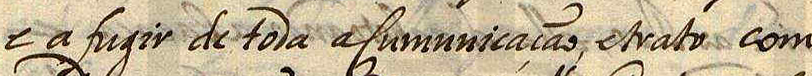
e a fugir de toda a Cumunicação, e trato com
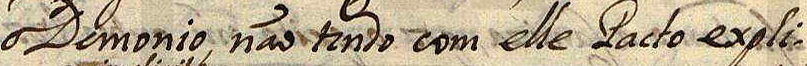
o Demonio, não tendo com elle Pacto expli
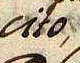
cito
